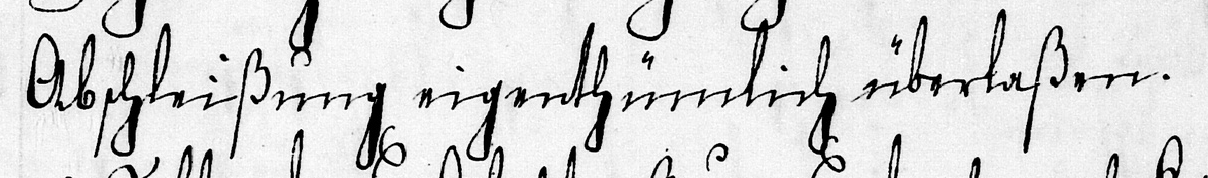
Abschleißung eigenthümlich überlaßen.
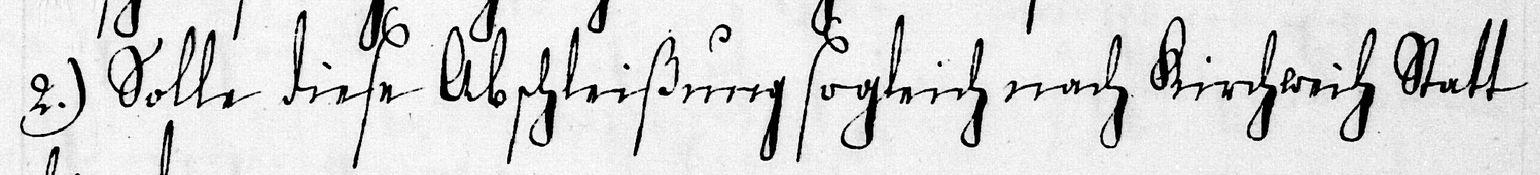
2.) Solle diese Abschleißung sogleich nach Kirchweih Statt
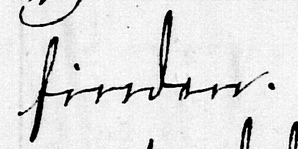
finden.
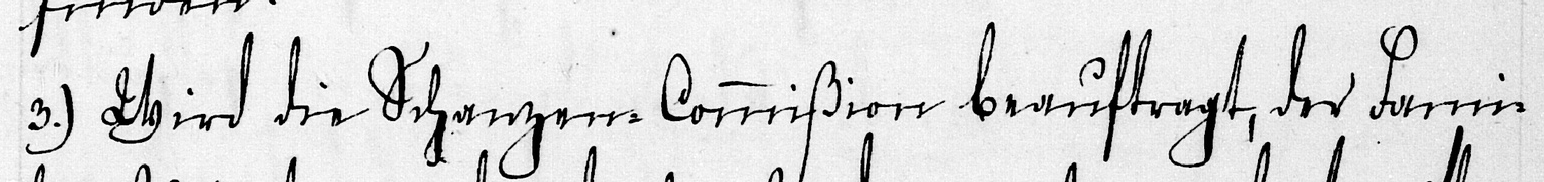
3.) Wir die Schanzen-Commißion beauftragt, der Fami¬
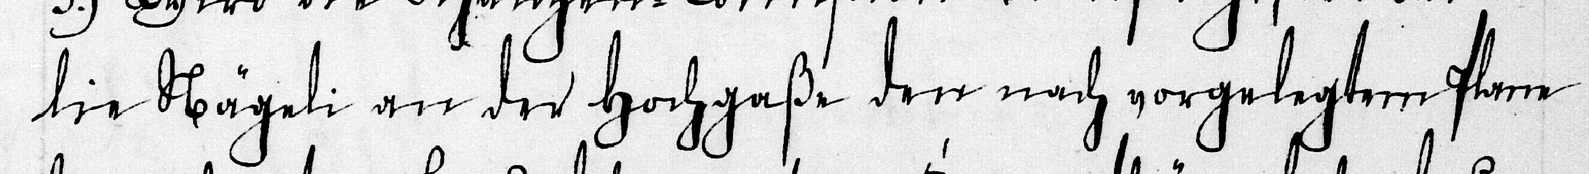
lie Nägeli an der Hochgaße den nach vorgelegtem Plane
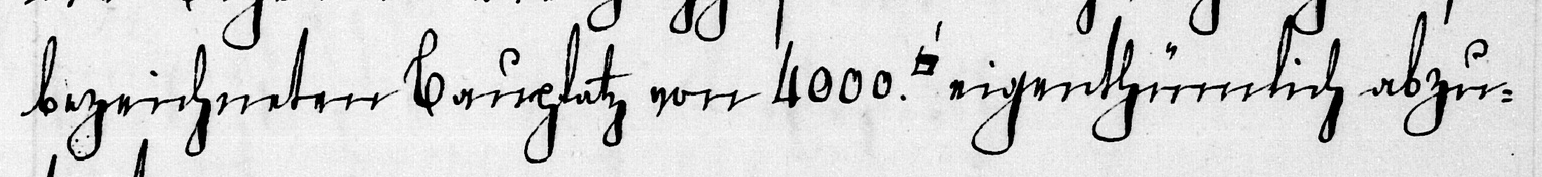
bezeichneten Bauplatz von 4000.□’eigenthümlich abzu¬
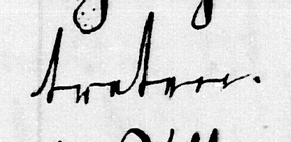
treten.
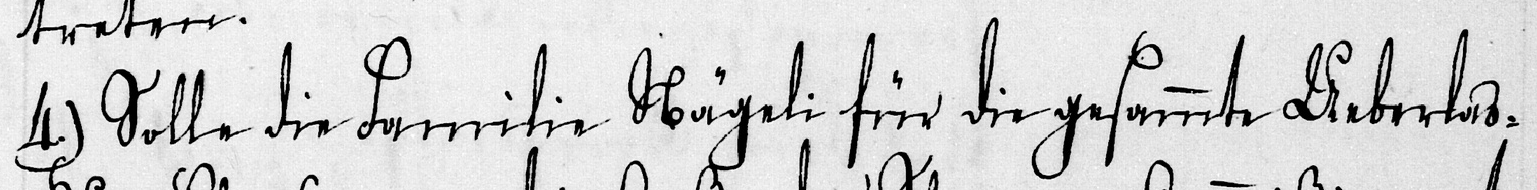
4.) Solle die Familie Nägeli für die gesammte Ueberlaß¬
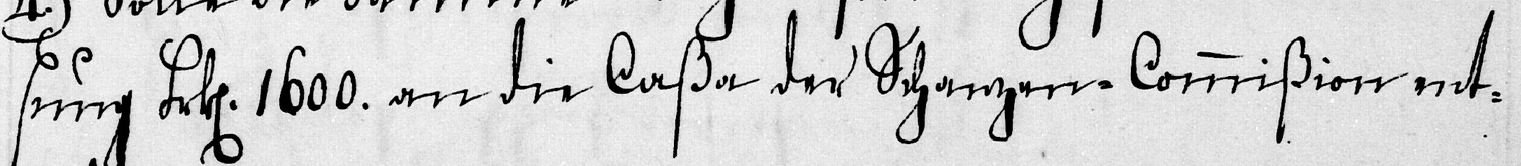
ung Frk[en]. 1600. an die Caßa der Schanzen-Commißion ent¬
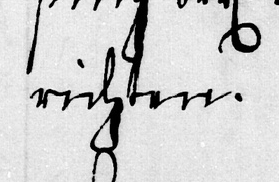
richten.
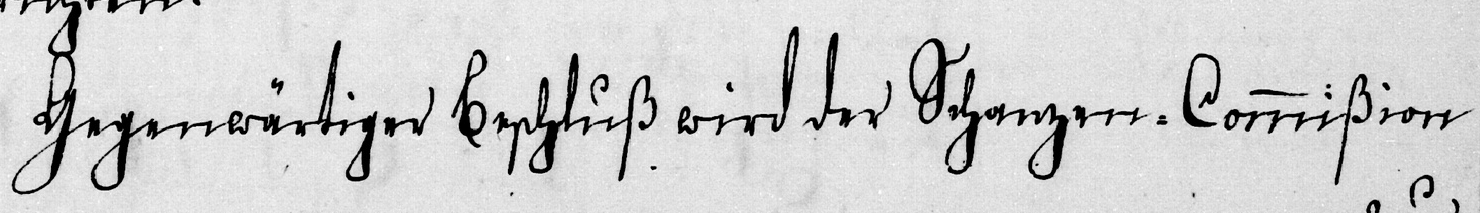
Gegenwärtiger Beschluß wird der Schanzen-Commißion
